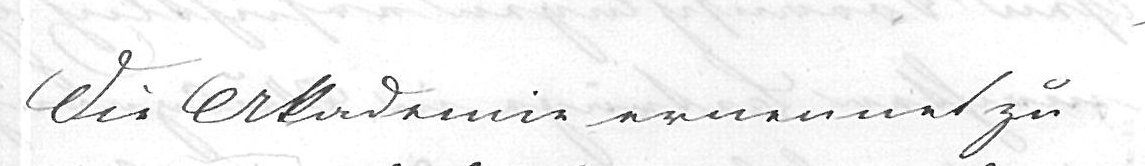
Die Akademie ernennet zu
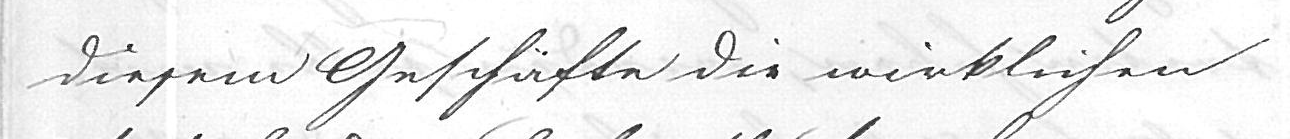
diesem Geschäfte die wirklichen
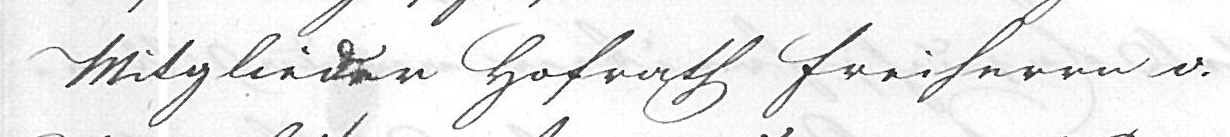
Mitglieder Hofrath Freiherrn v.
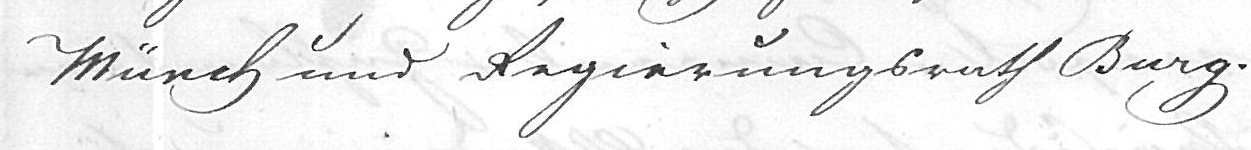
Münch und Regierungsrath Burg.
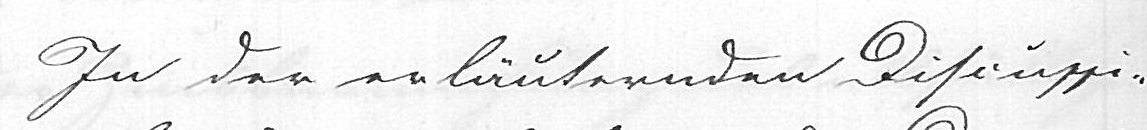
In der erläuternden Discussi-
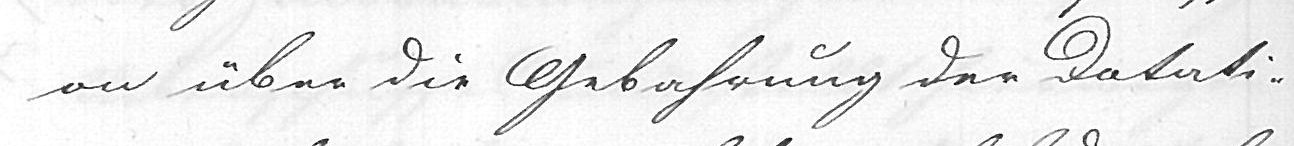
on über die Gebahrung der Dotati-
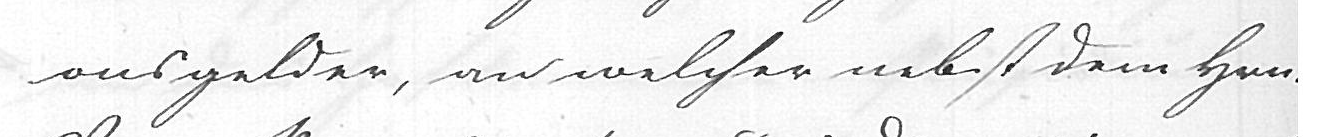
onsgelder, an welcher nebst dem Hrn.
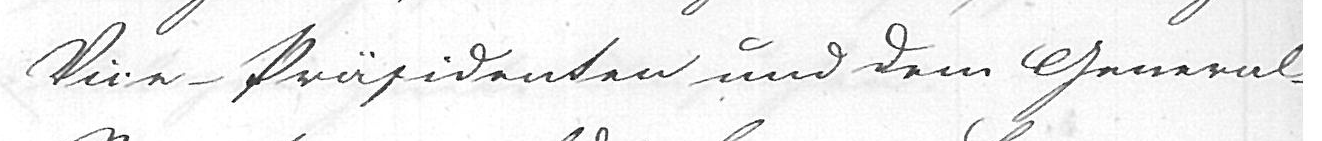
Vice-Präsidenten und dem General-
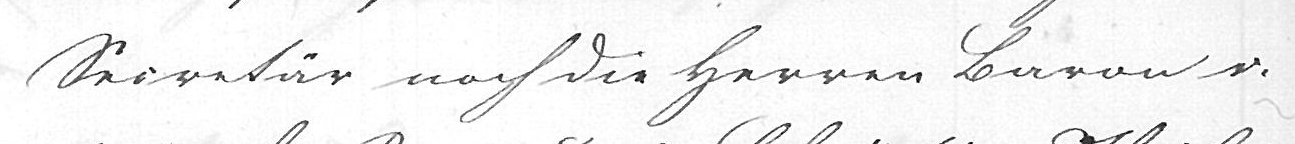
Secretär noch die Herren Baron v.
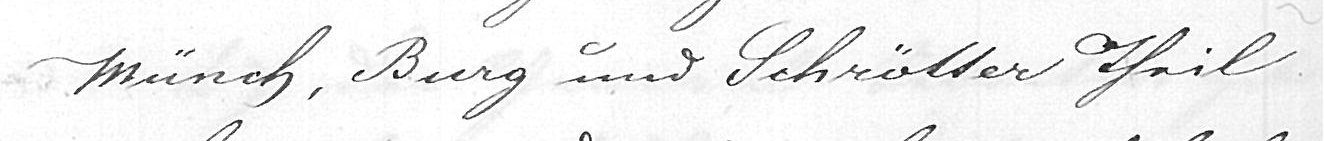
Münch, Burg und Schrötter Theil
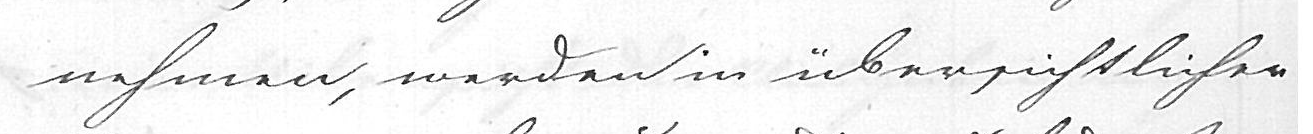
nehmen, werden im übersichtlicher
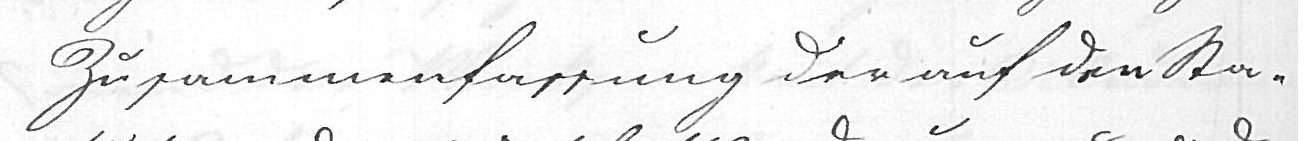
Zusammenfassung der auf den Sta-
